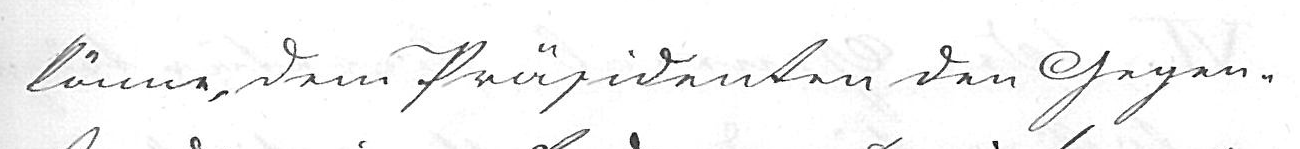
könne, dem Präsidenten den Gegen-
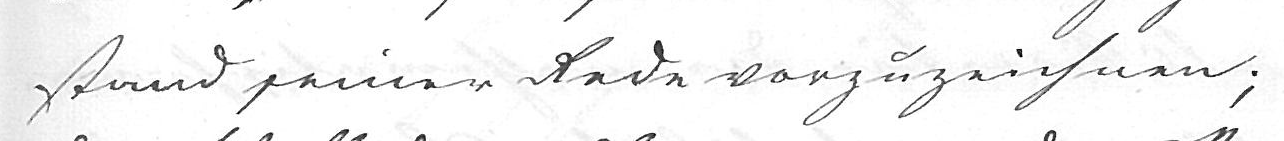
stand seiner Rede vorzuzeichnen;
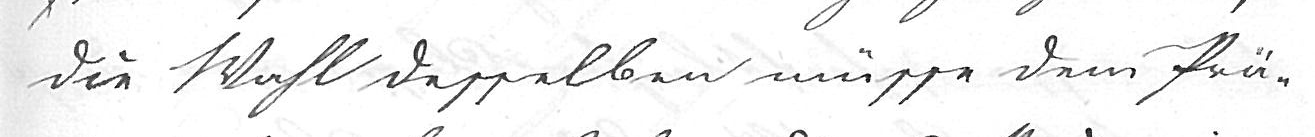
die Wahl desselben müsse dem Prä-
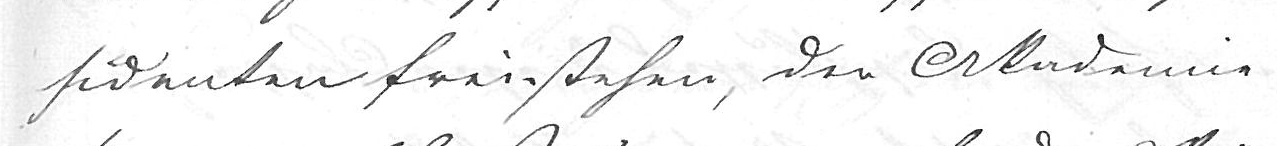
sidenten freistehen, der Akademie
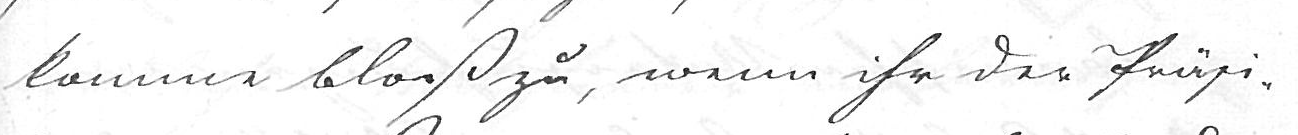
komme bloß zu, wenn ihr der Präsi-
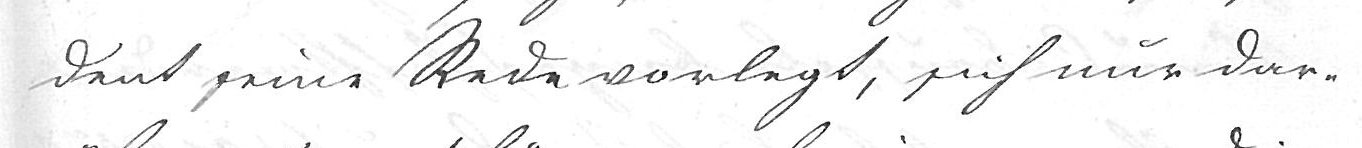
dent seine Rede vorlegt, sich nur dar-
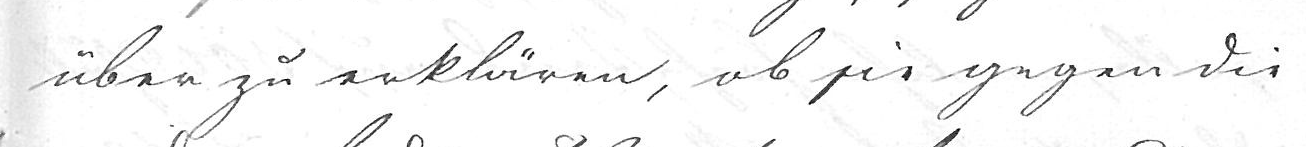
über zu erklären, ob sie gegen die
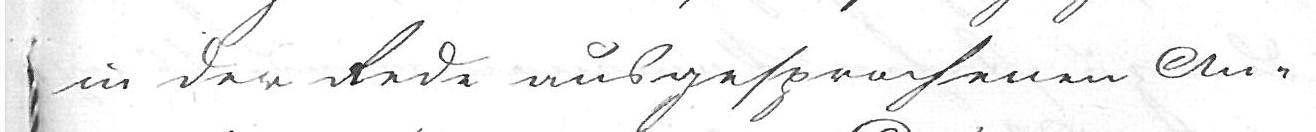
in der Rede ausgesprochenen An-
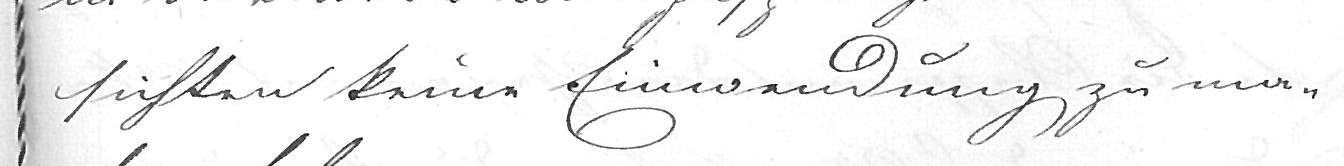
Ansichten keine Einwendung zu ma-
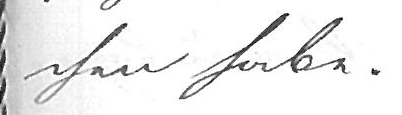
chen habe.
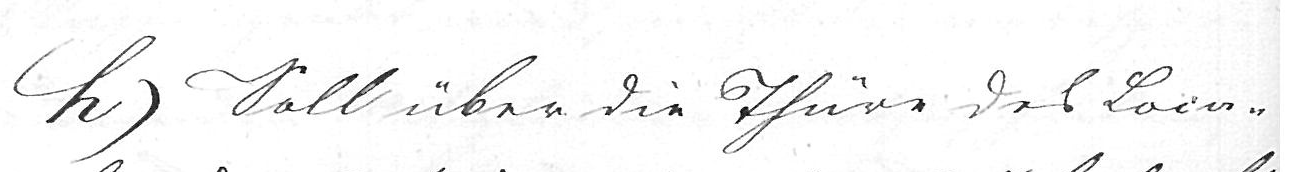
h) Soll über die Thüre des Loca-
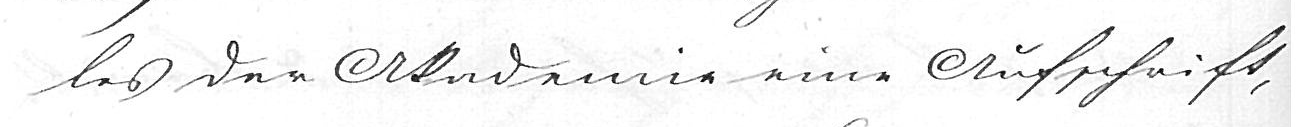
les der Akademie eine Aufschrift,
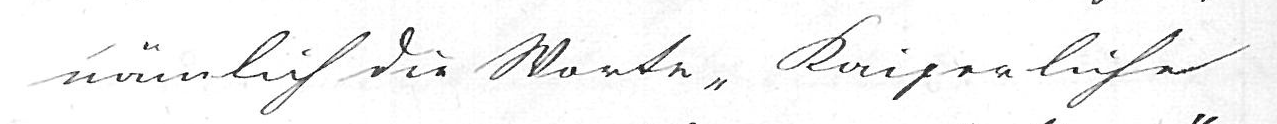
nämlich die Worte "Kaiserliche
